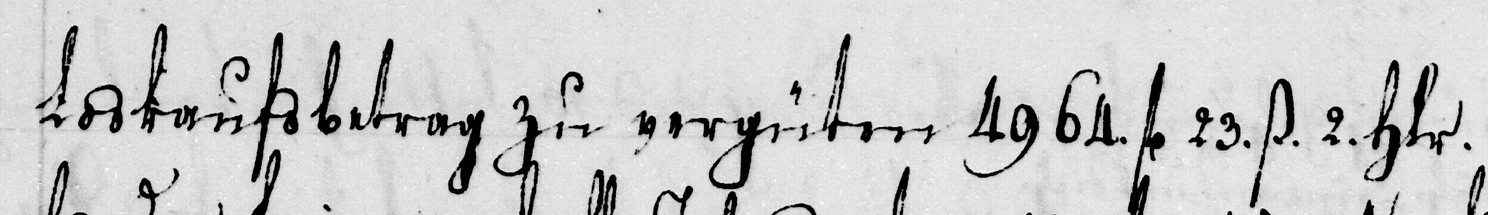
Loskaufsbetrag zu vergüten 4964. fl. 23. ß. 2. Hlr.
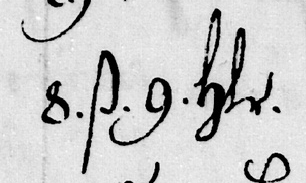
ß. 9. Hlr.
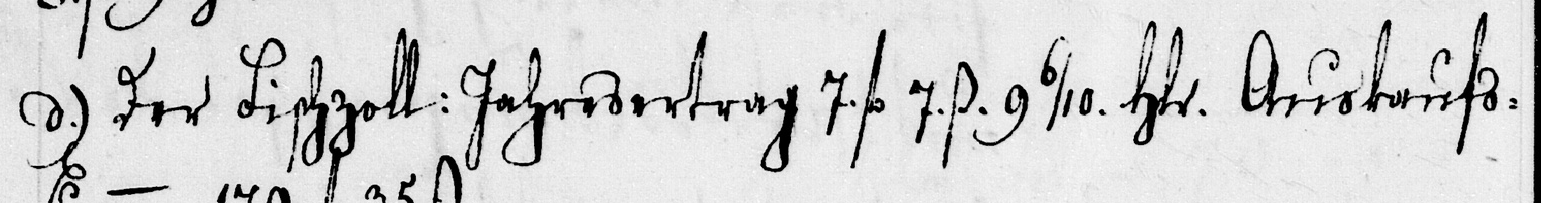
d.) Der Fischzoll: Jahresertrag 7. fl. 7. ß. 9 6/10. Hlr. Aus¬
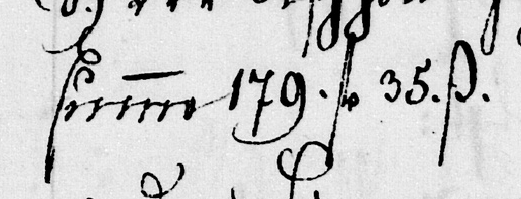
summe 179. fl. 35. ß.
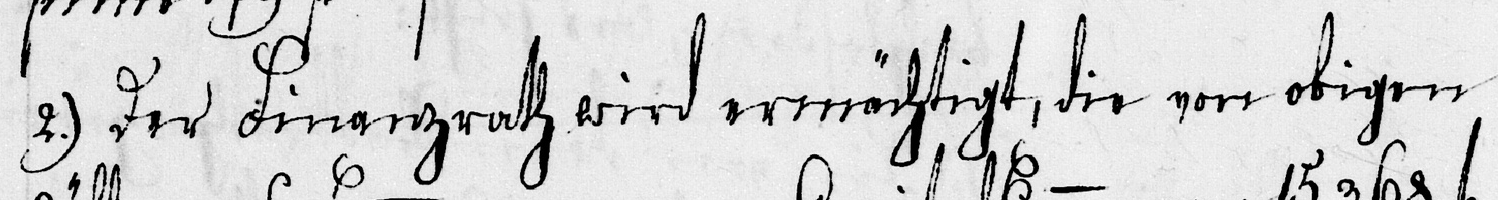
2.) Der Finanzrath wird ermächtigt, die von obigen
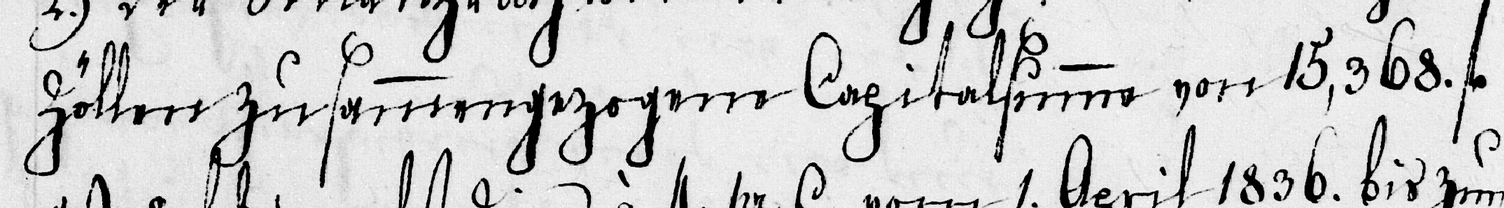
Zöllen zusammengezogene Capitalsumme von 15,368. fl.
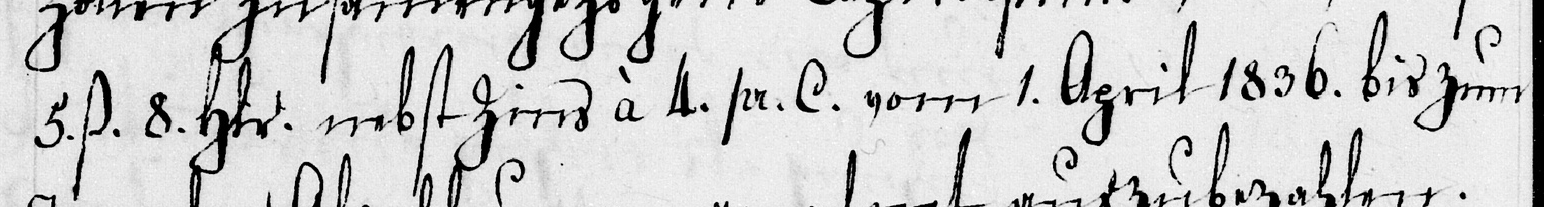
5. ß. 8. Hlr. nebst Zins à 4. pr. C. vom 1. April 1836. bis zum
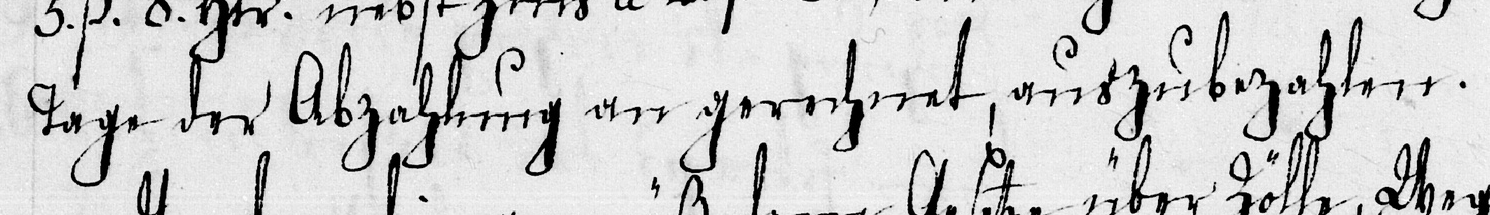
Tage der Abzahlung an gerechnet, auszubezahlen.
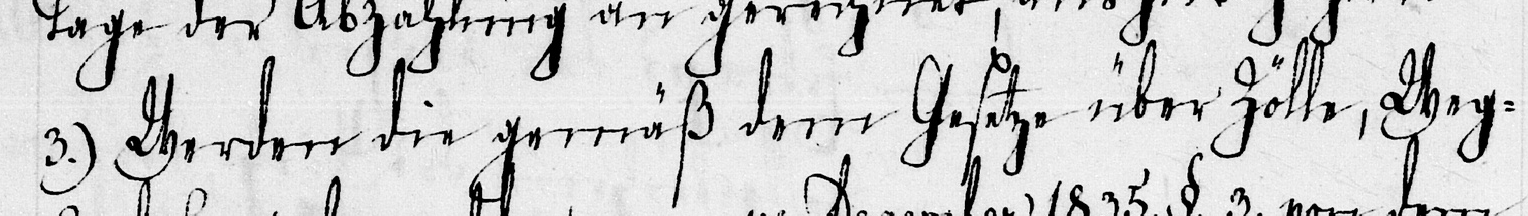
3.) Werden gemäß dem Gesetze über Zölle, Weg-
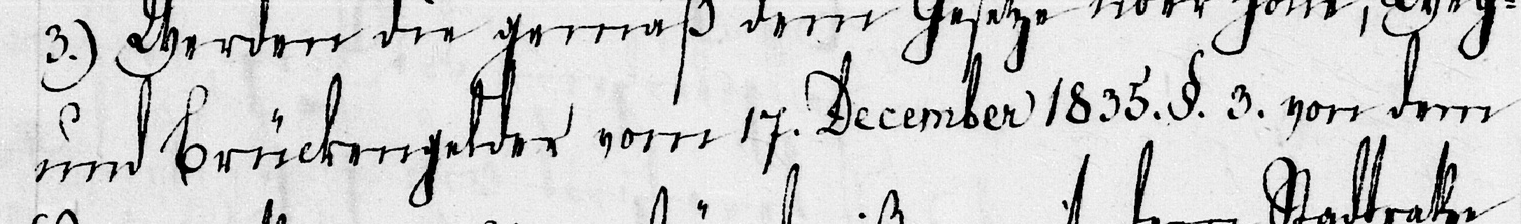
und Brückengelder vom 17. December 1835. §. 3. von dem
